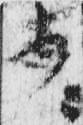十月
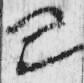己
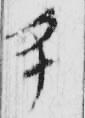丑
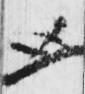之
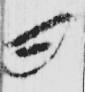日
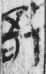敔
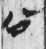公
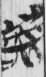若
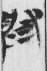○（雄）
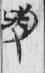受
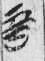○（期）
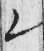乙
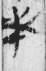未
